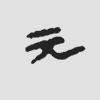亓（其）
